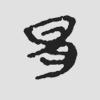日月
